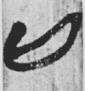㠯
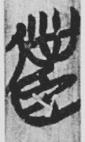○（僕）
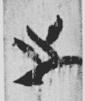之
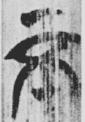不
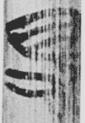○（得）
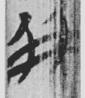幷
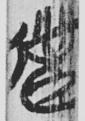○（僕）
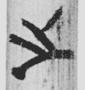之
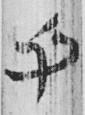父
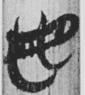母
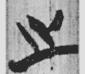之
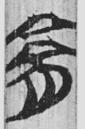骨
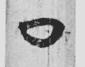厶（私）
